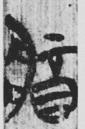𨟻（將）
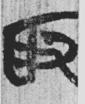取
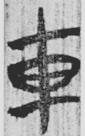車
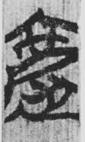被（披）
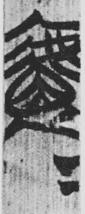○（襌衣）
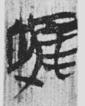○（脽）
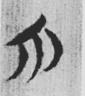○（掌）
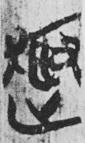趣（騶）
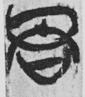君
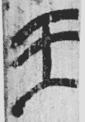王
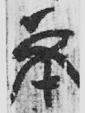不
